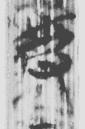皮
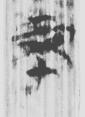不
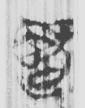智
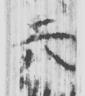亓
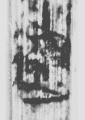{止達}
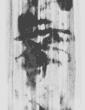不
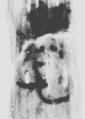𢝬
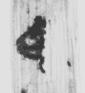{宀𠁩}
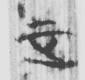正
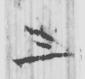之
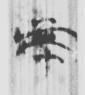不
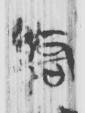紿
